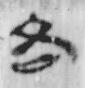各
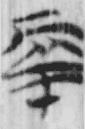兩
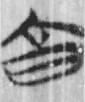亯
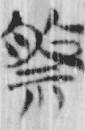祭
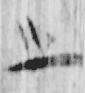之
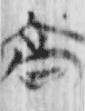高
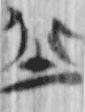丘
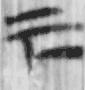下
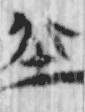丘
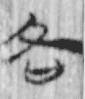各
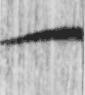一
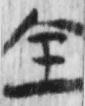全
